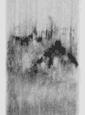{廿六}
